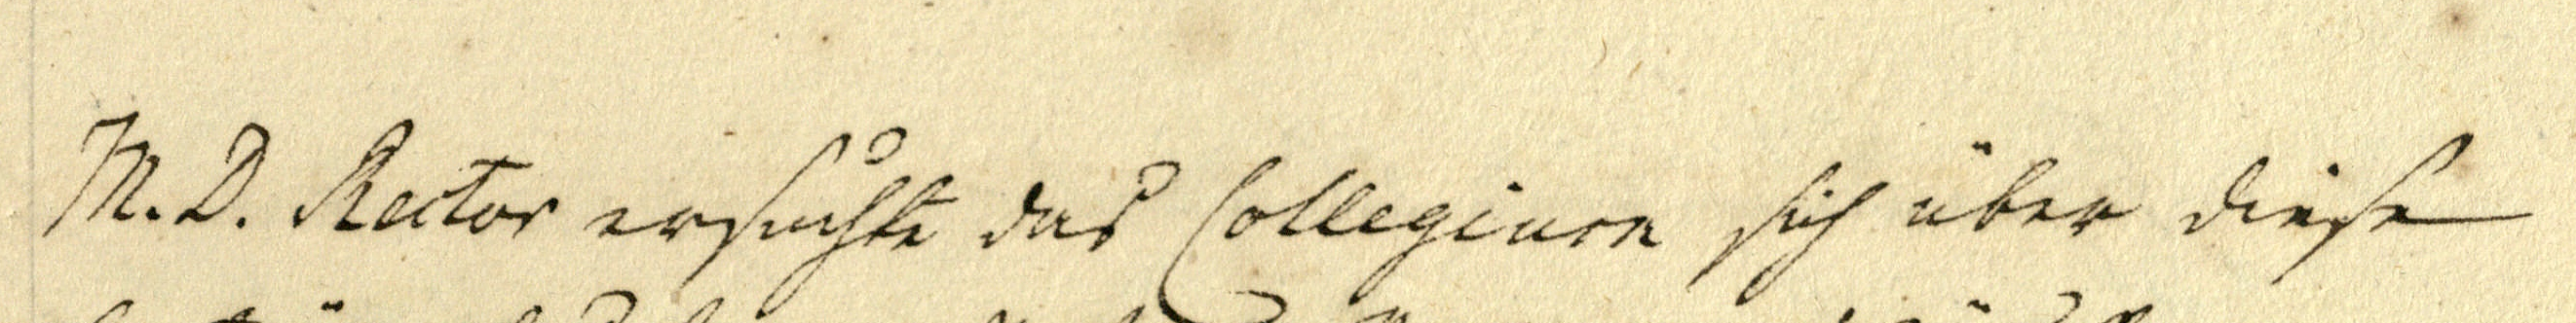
M. D. Rector ersuchte das Collegium sich über diese
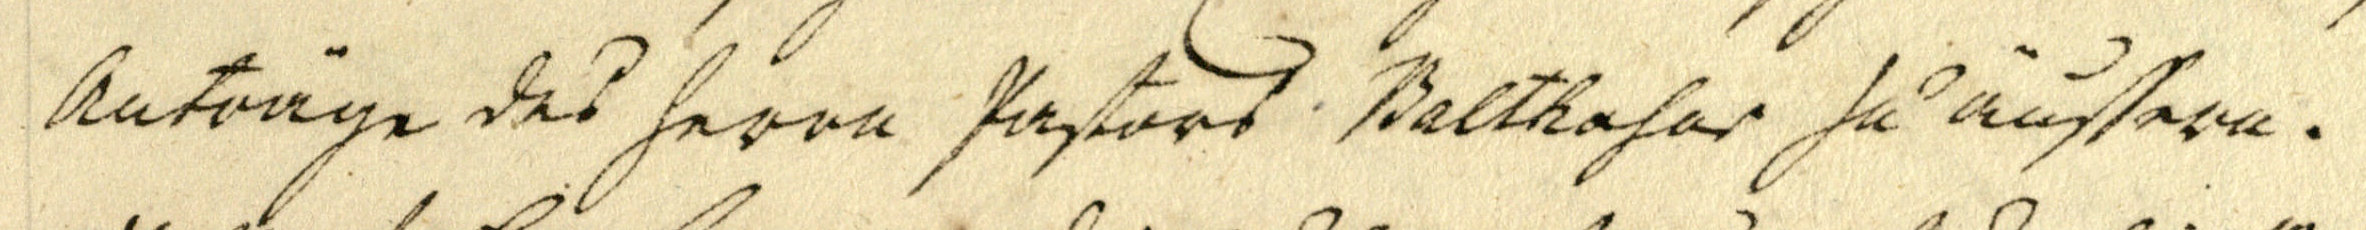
Anträge des herrn Pastors Balthasar zu äussern.
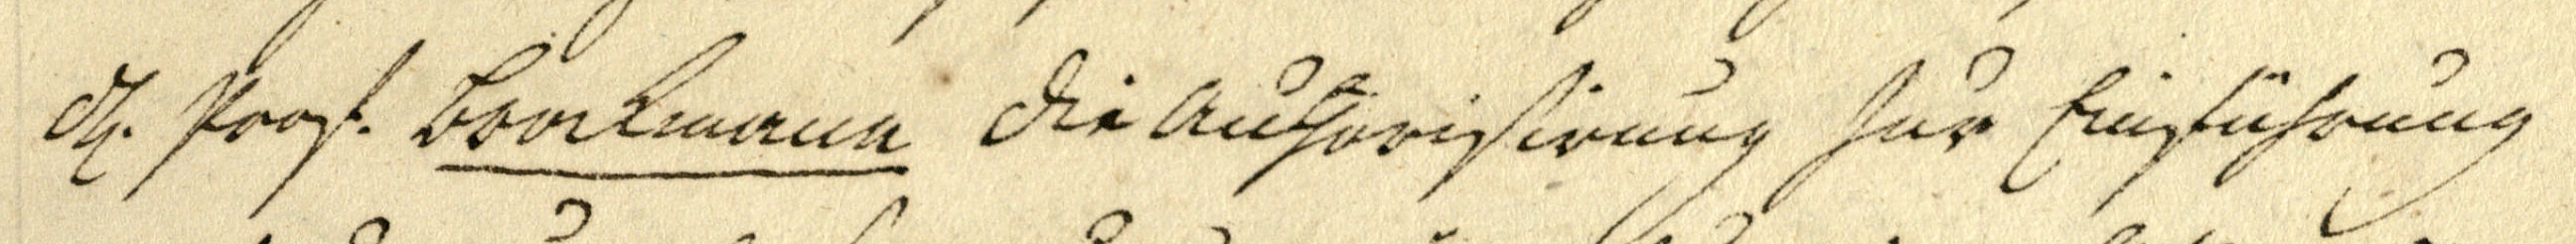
dh. Prof. Brockmann. Die Authorisirung zur Einführung
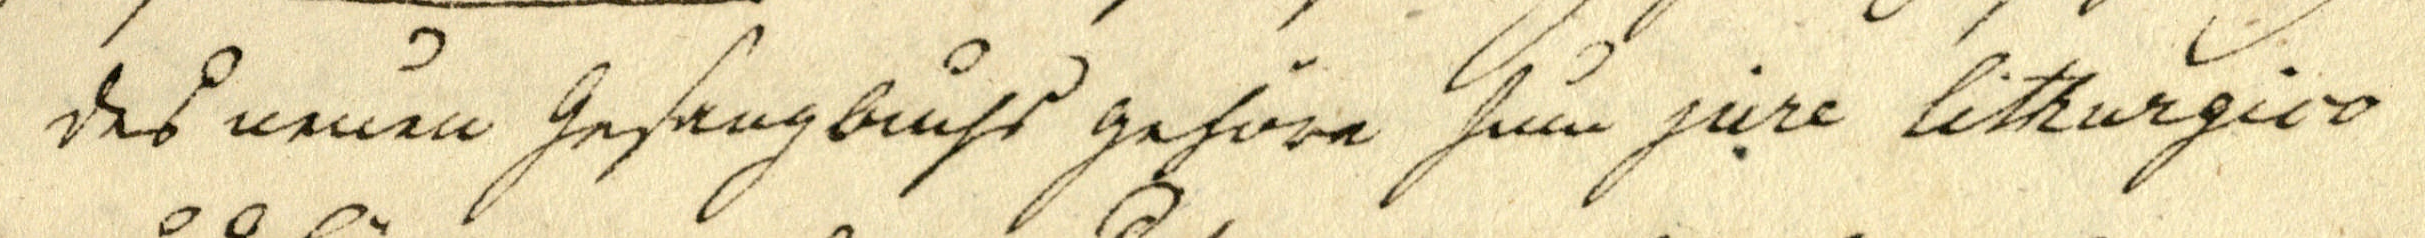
des neuen Gesangbuchs gehöre zum jure lithurgico
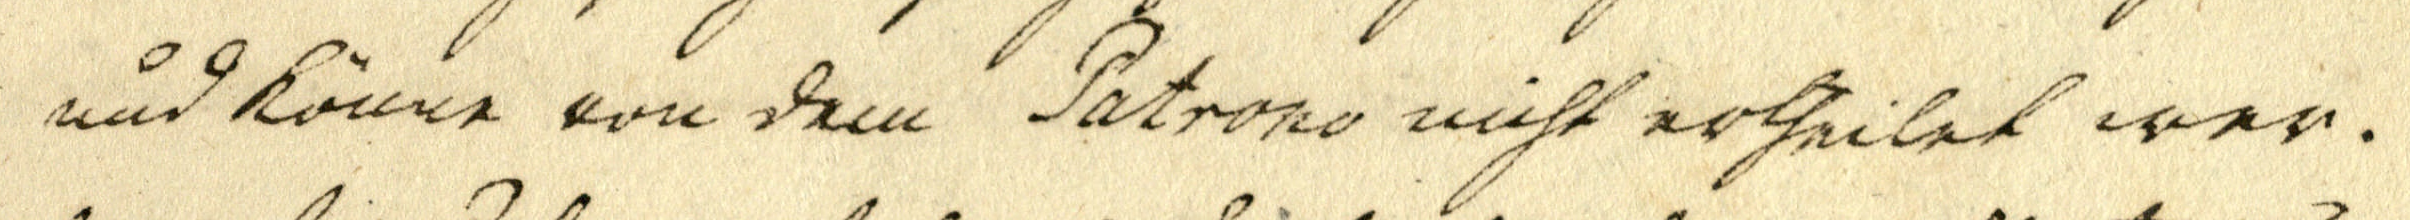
und könne von dem Patrono nicht ertheilet wer¬
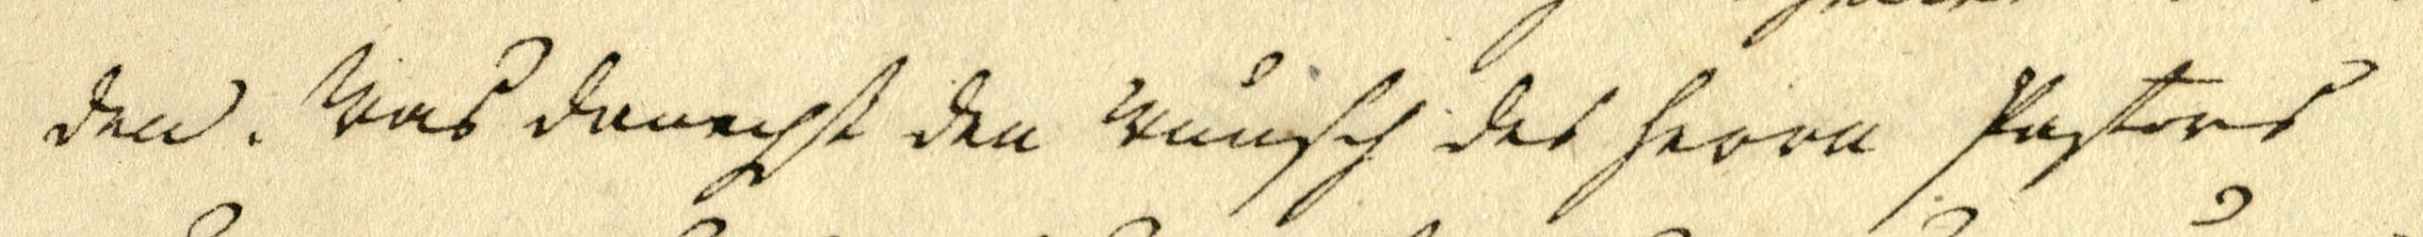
den. Was danechst den Wunsch des herrn Pastors
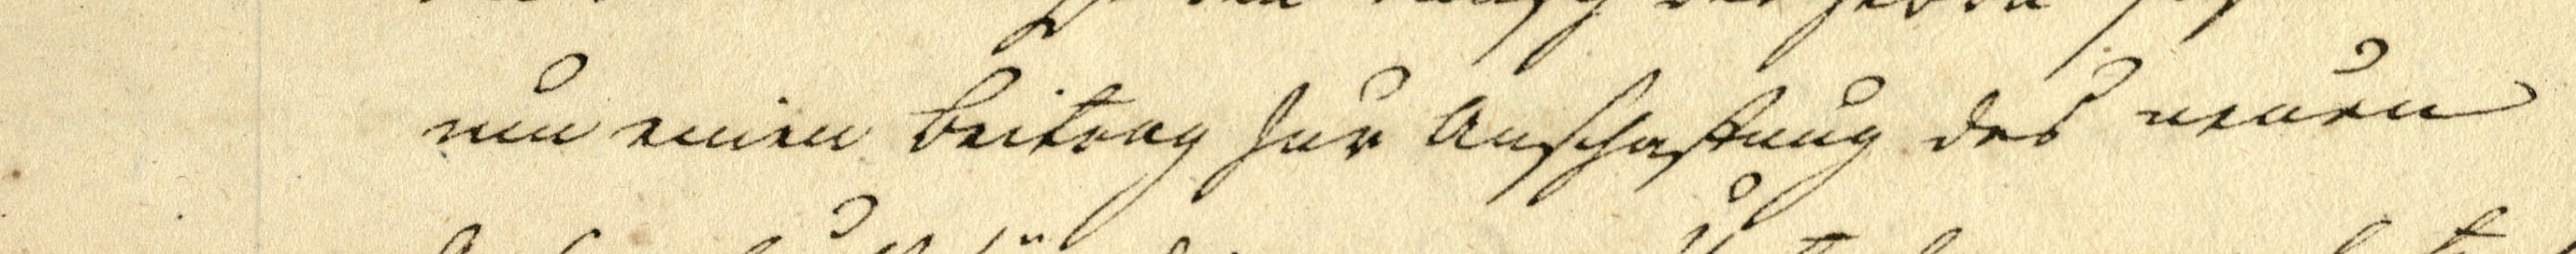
um einen Beitrag zur Anschafung des neuen
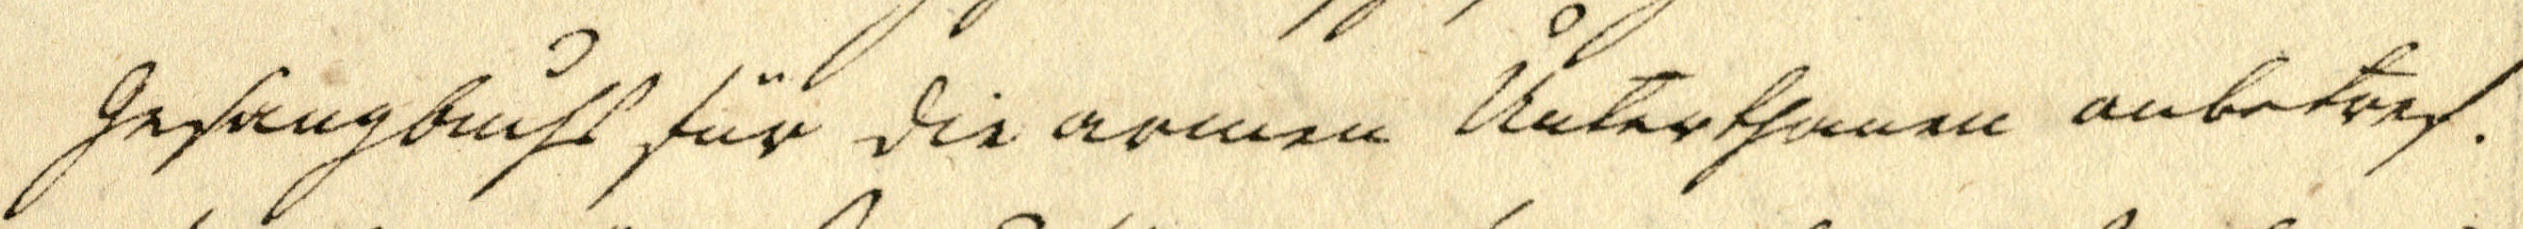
Gesangbuchs für die armen Unterthanen anbetref¬
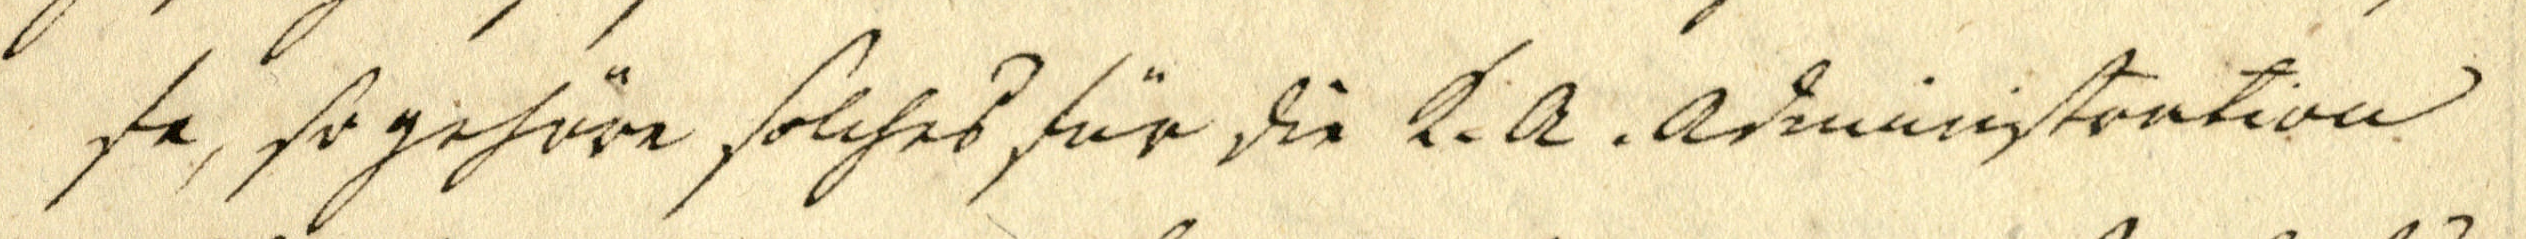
fe, so gehöre solches für die K. A. Administration
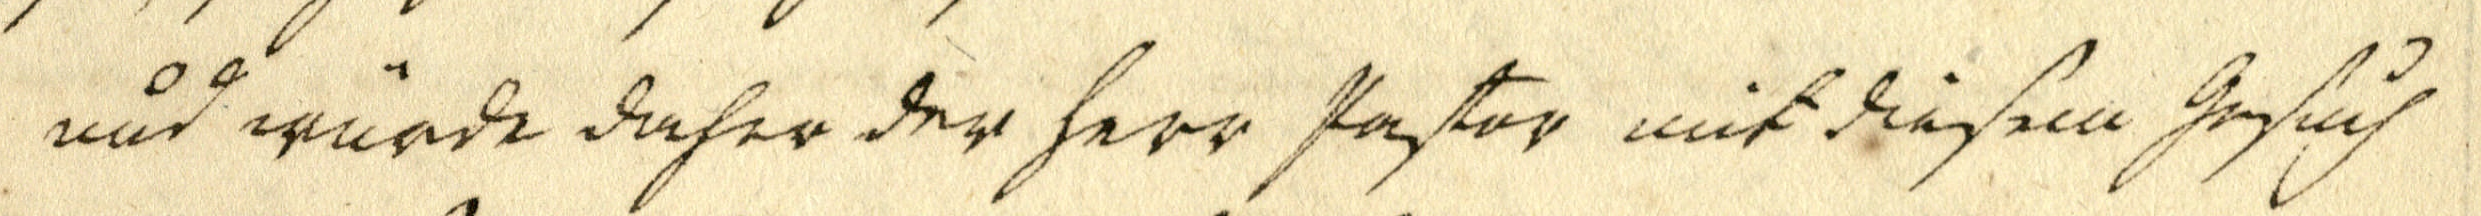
und würde daher der herr Pastor mit diesem Gesuch
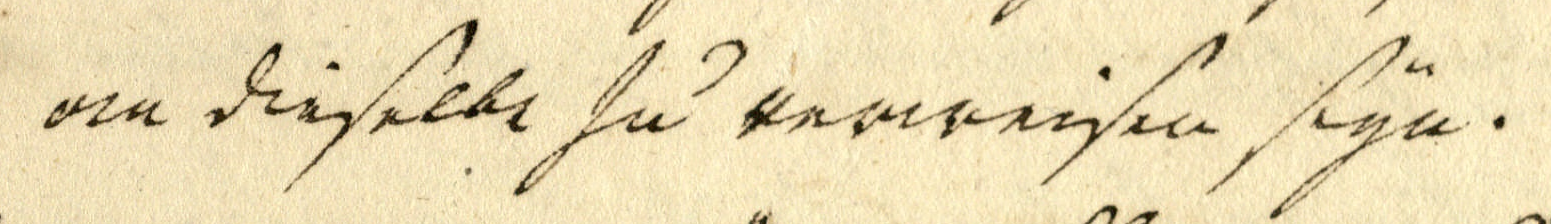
an dieselbe zu verweisen seÿn.
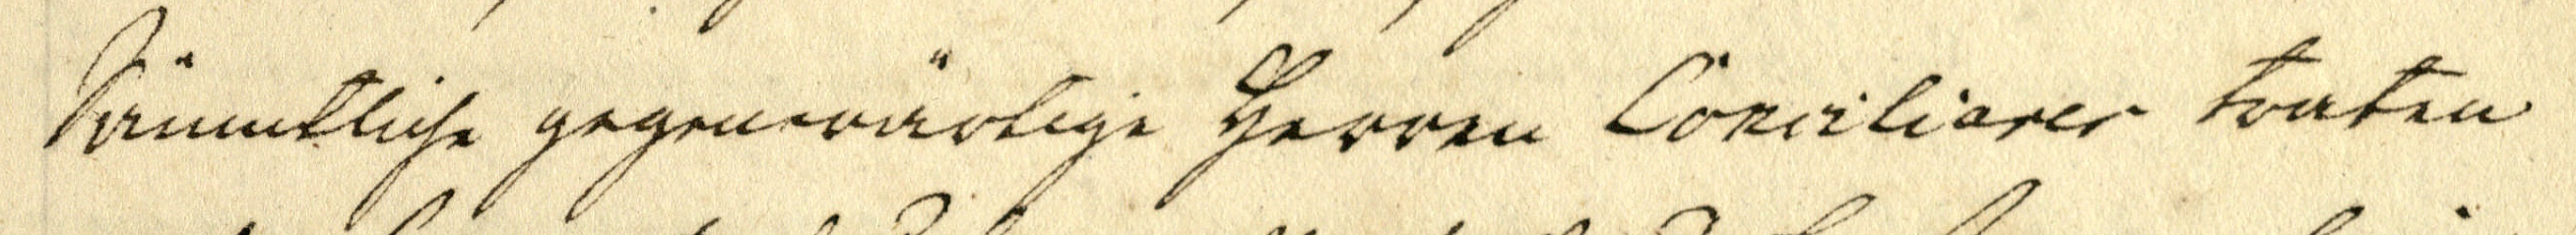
Sämmtliche gegenwärtige Herren Conciliares traten
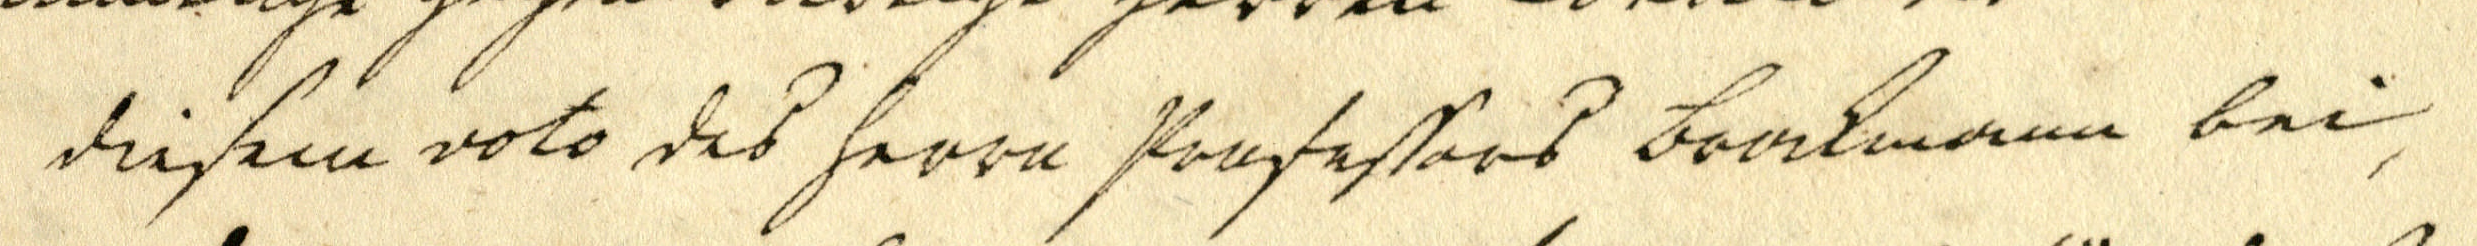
diesem voto des herrn Professors Brockmann bei,
